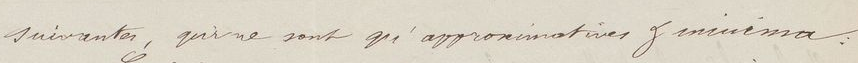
suivantes, qui ne sont qu'approximatives & minima:
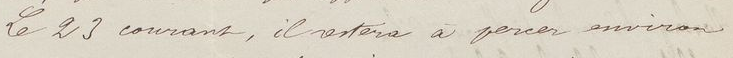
Le 23 courant, il restera à percer environ
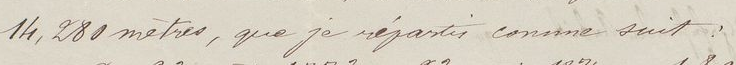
14,280 mètres, que je répartis comme suit:
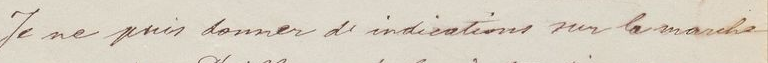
Je ne puis donner d'indications sur la marche
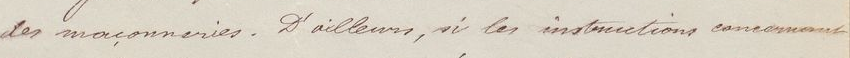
des maçonneries. D'ailleurs, si les instructions concernant
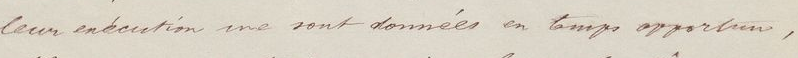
leur exécution me sont données en temps opportun,
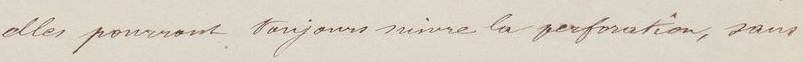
elles pourront toujours suivre la perforatîon, sans
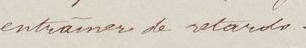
entraîner de retards.
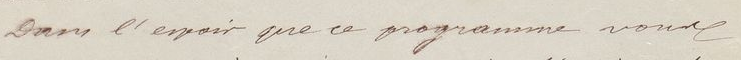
Dans l'espoir que ce programme vous
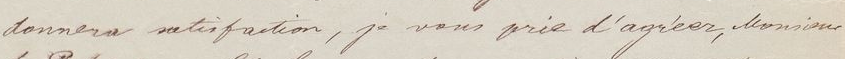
donnera satisfaction, je vous prie d'agréer, Monsieur
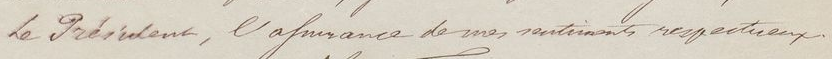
Le Président, l'assurance de mes sentiments respectueux.
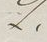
L.
